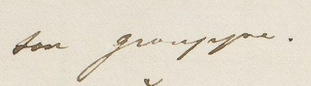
son grouppe.
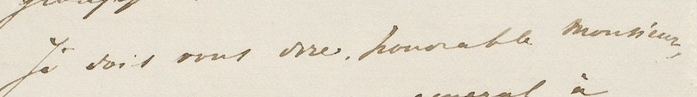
Je dois vous dire, honorable Monsieur,
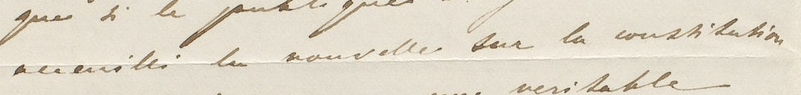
acceuilli la nouvelle sur la constitution
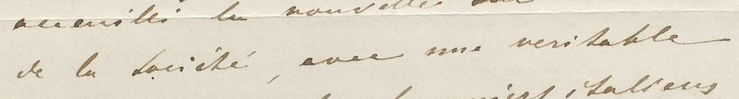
de la Société, avec une veritable
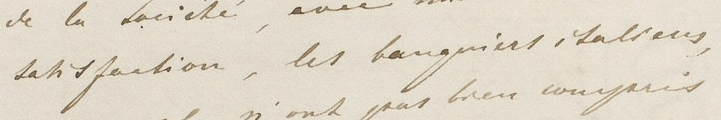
satisfaction, les banquiers italiens,
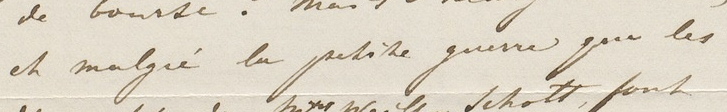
et malgré la petite guerre que les
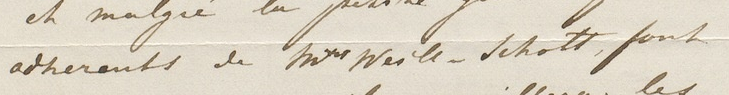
adherants de MrWeill-Schott, font
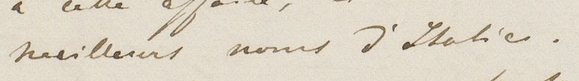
meilleurs noms d'Italie.
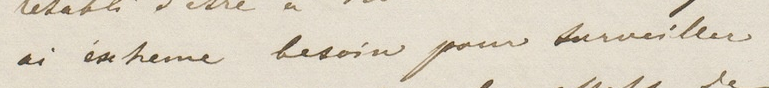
ai éxtreme besoin pour surveiller
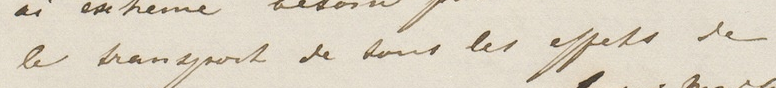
le transport de tous les effets de
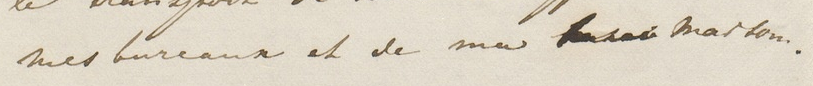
mes bureaux et de ma ...maison.
